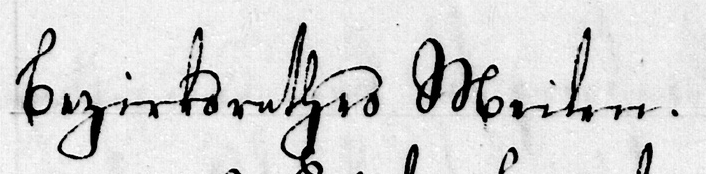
Bezirksrathes Meilen.
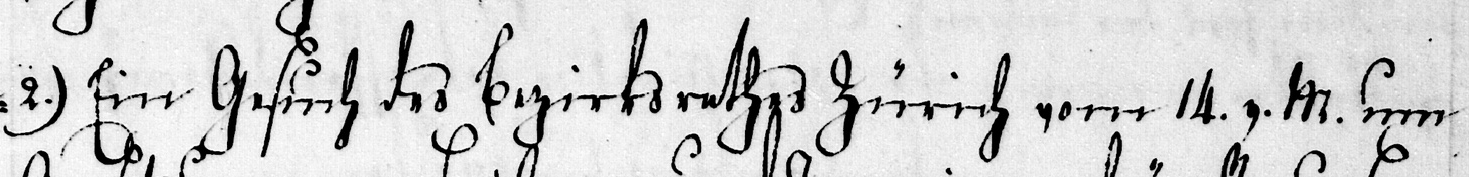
2.) Ein Gesuch des Bezirksrathes Zürich vom 14. v. M. um
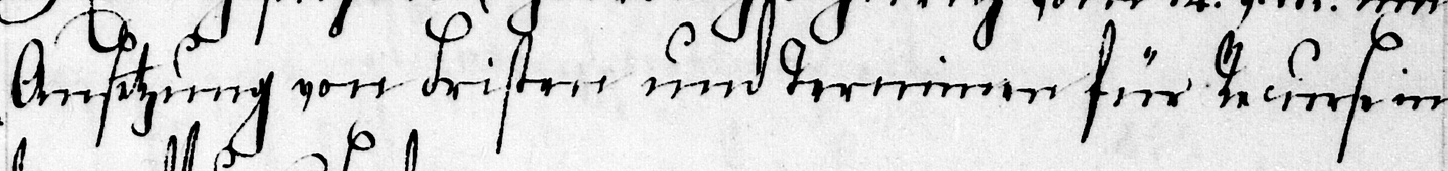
Ansetzung von Fristen und Terminen für Recurse in
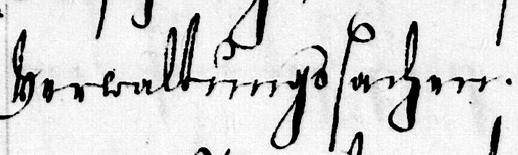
Verwaltungssachen.
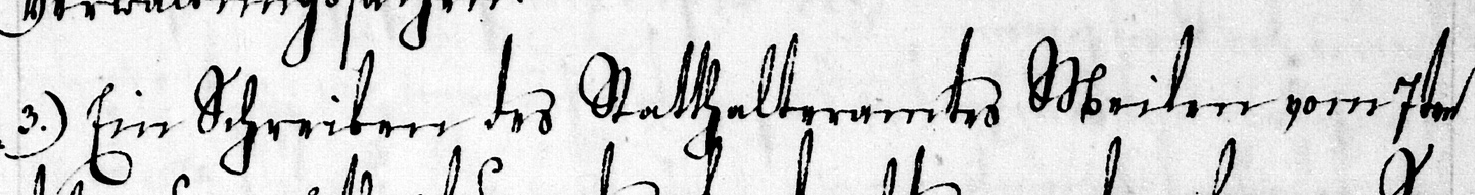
3.) Ein Schreiben des Statthalteramtes Meilen vom 7ten
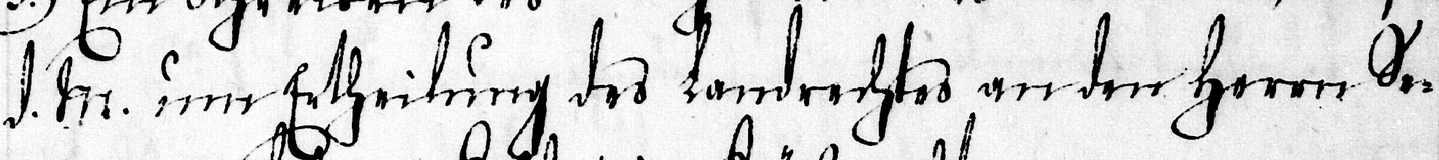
d. M. um Ertheilung des Landrechtes an den Herrn Se¬
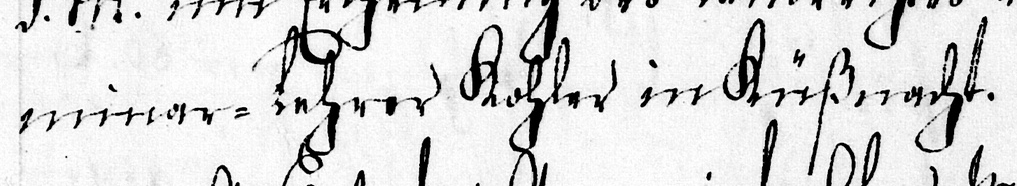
minar-Lehrer Kohler in Küßnacht.
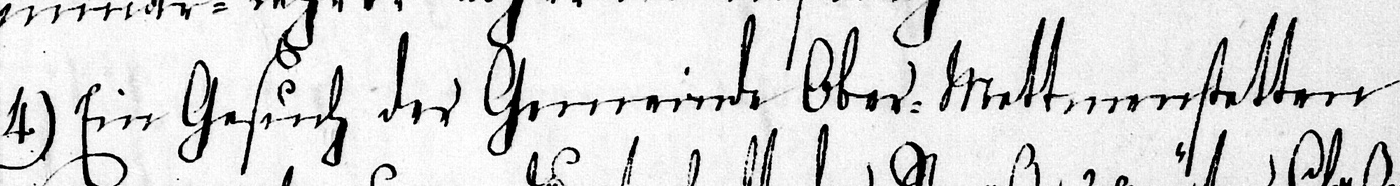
4.) Ein Gesuch der Gemeinde Ober-Mettmenstetten
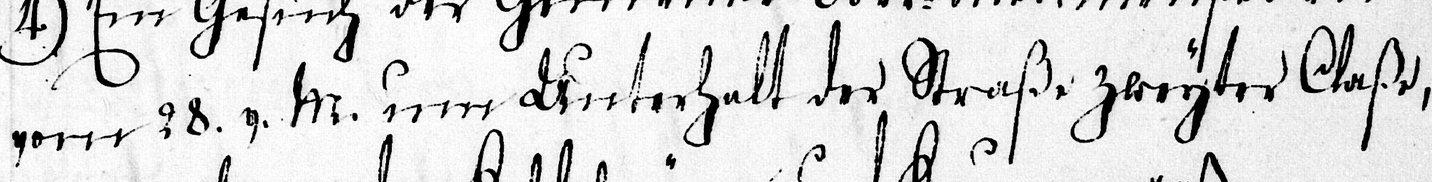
vom 28. v. M. um Unterhalt der Straße zweyter Claße,
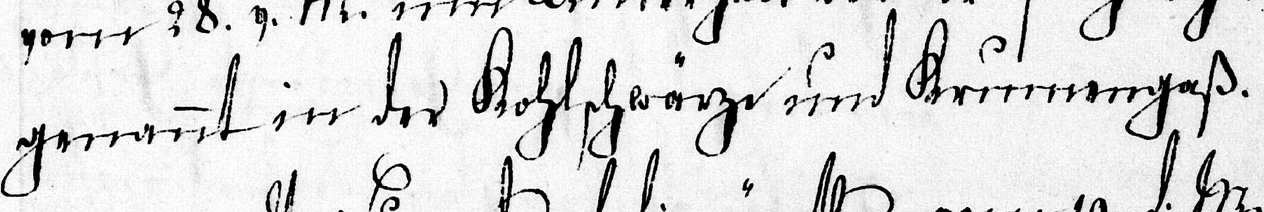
genannt in der Kohlschwärze und Krumengaß.
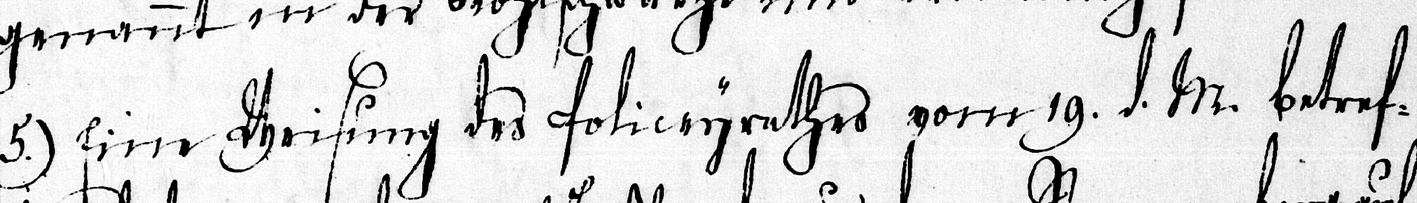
5.) Eine Weisung des Policeyrathes vom 19. d. M. betref¬
